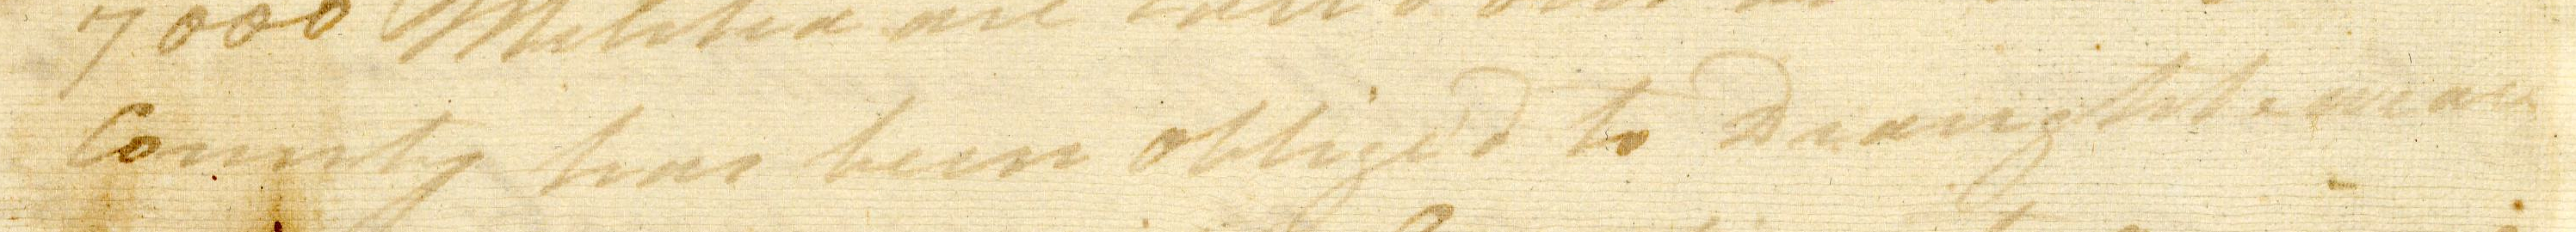County has been obliged to Draughte weak
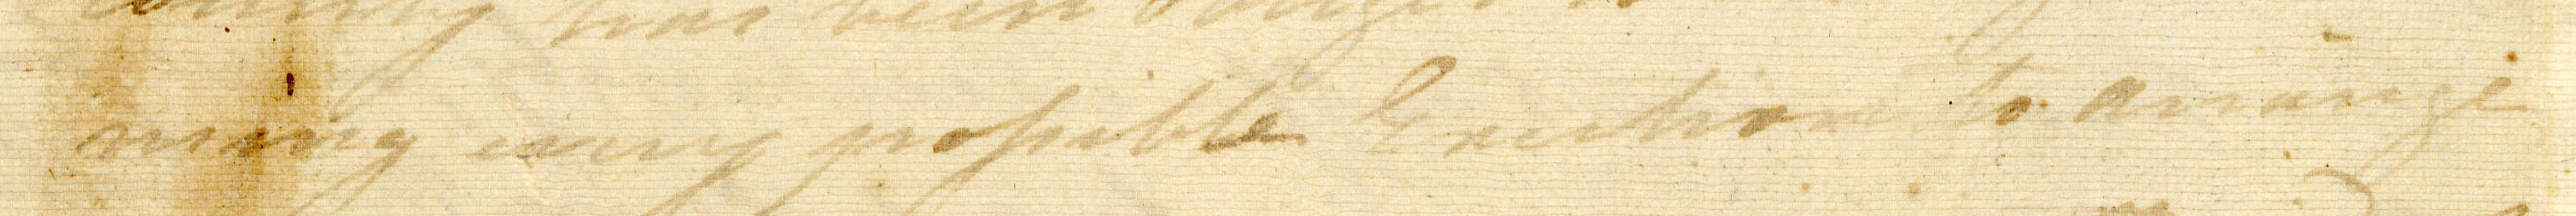ning every possible Erection to arrange
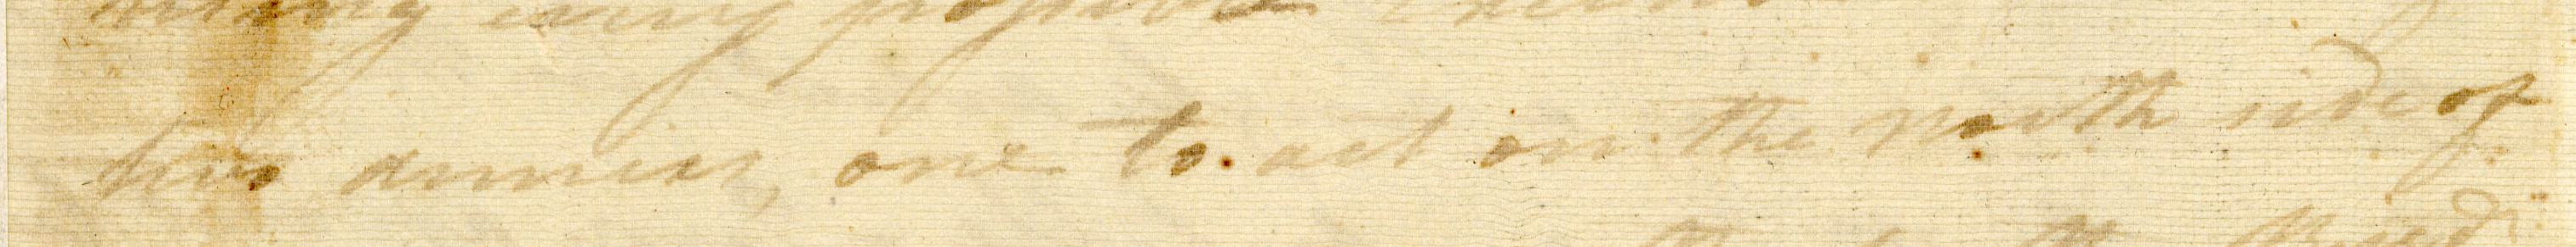two armies, one to act on the north side of
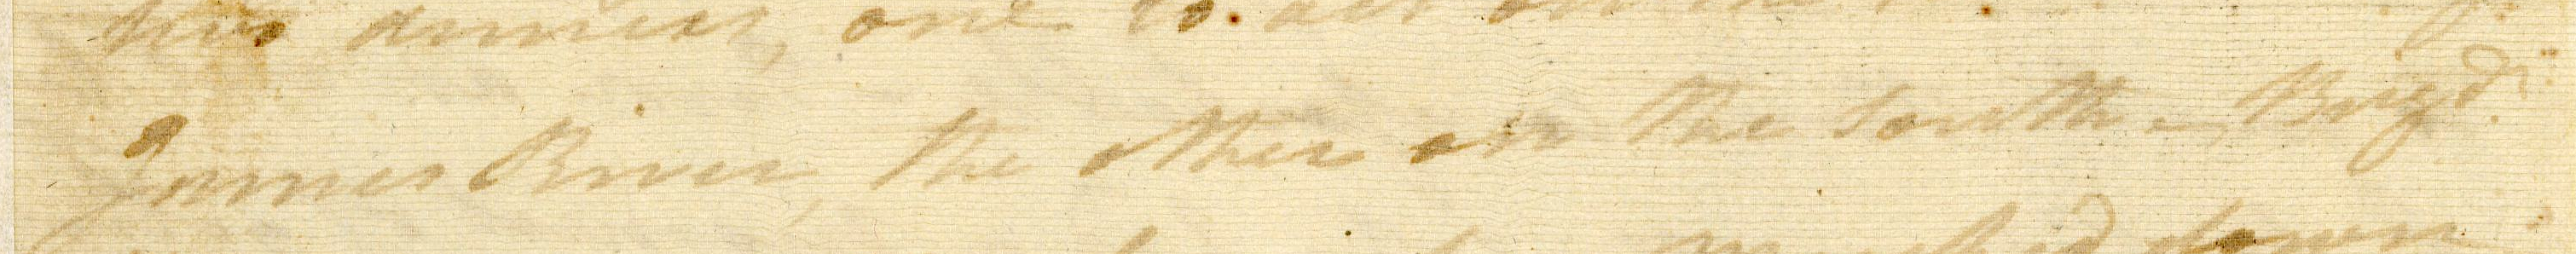James River, the other on the South. Brigd^r
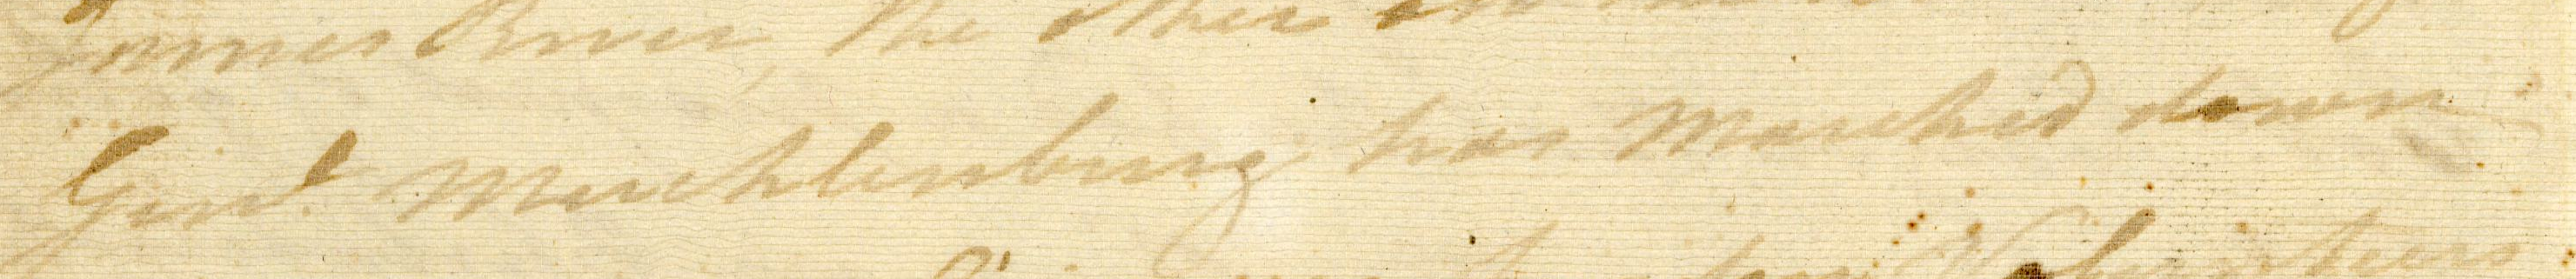Gen^l Muhlenburg has marched down
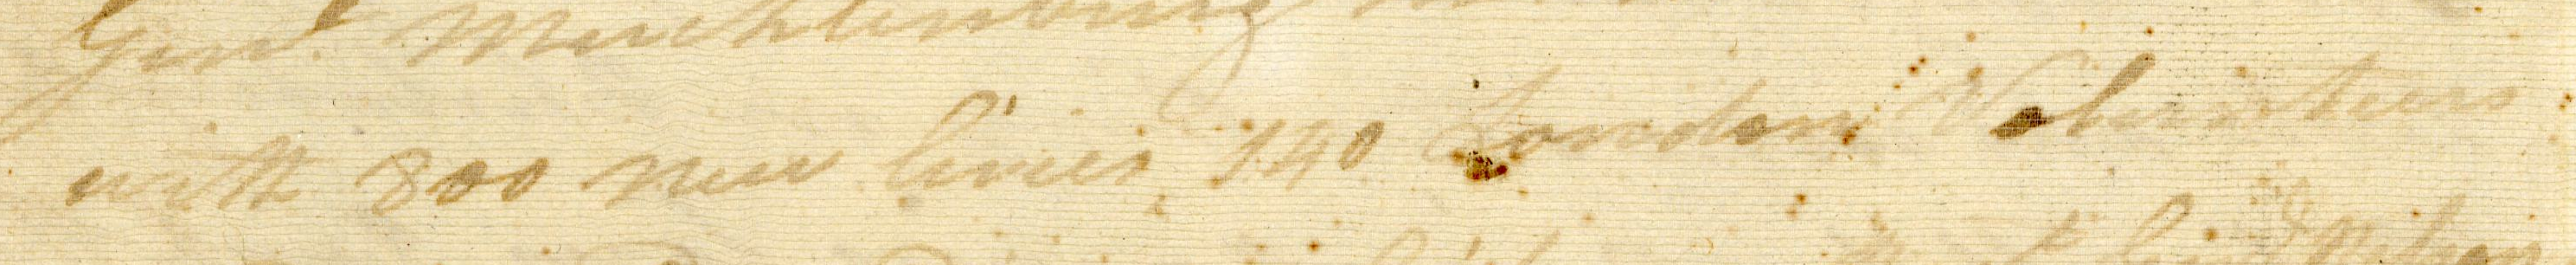with 800 new livies 140 London Volunteers
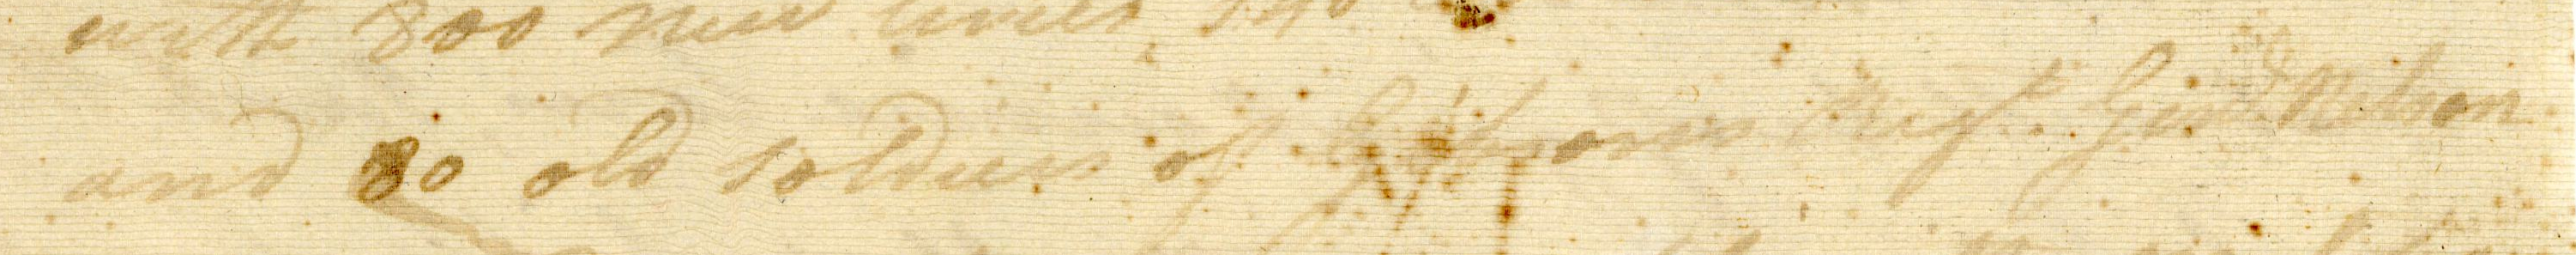and 80 old soldiers of Gibson's Reg^t. Gen^l. Nelson
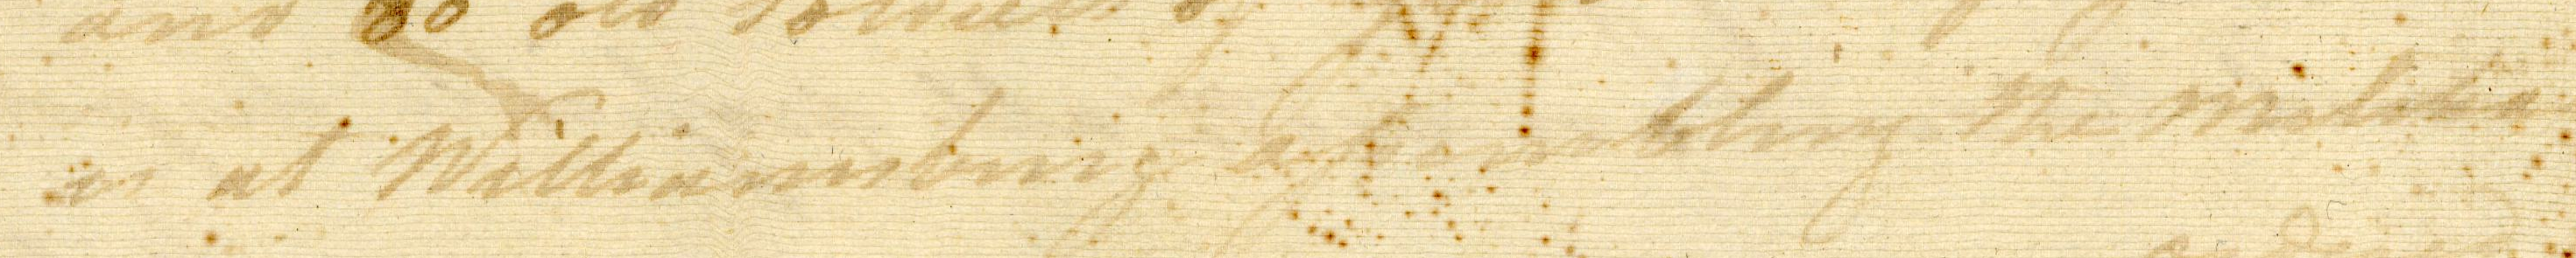is at Williamsburg assembling the militia
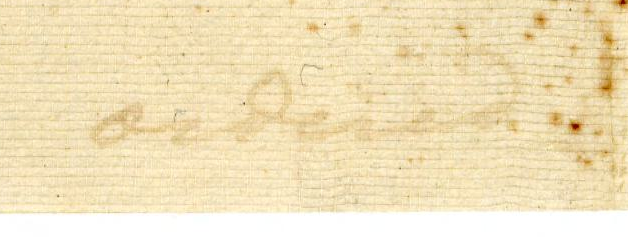ordered
